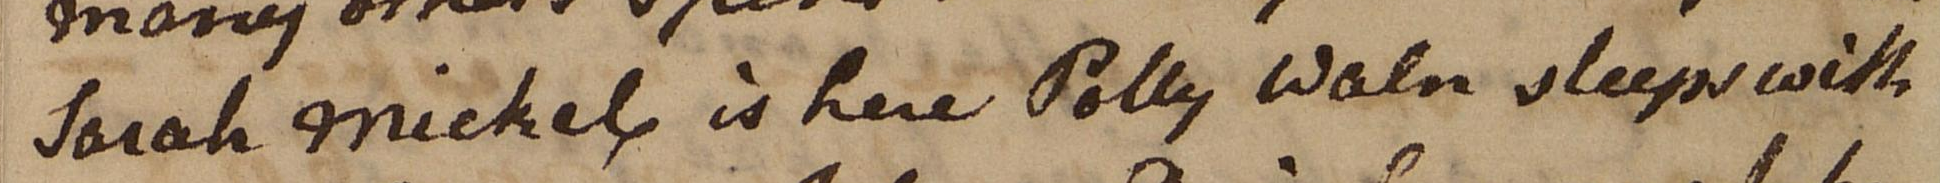Sarah Mickel is here Polly Waln sleeps with
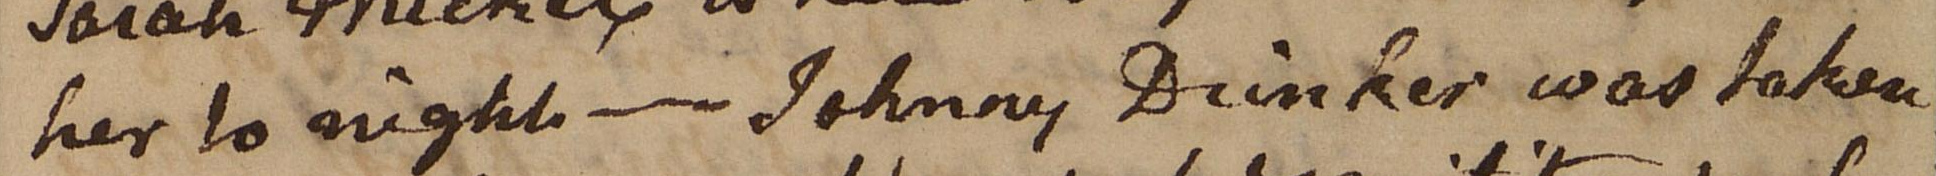her to nights- Johnny Drinker was taken
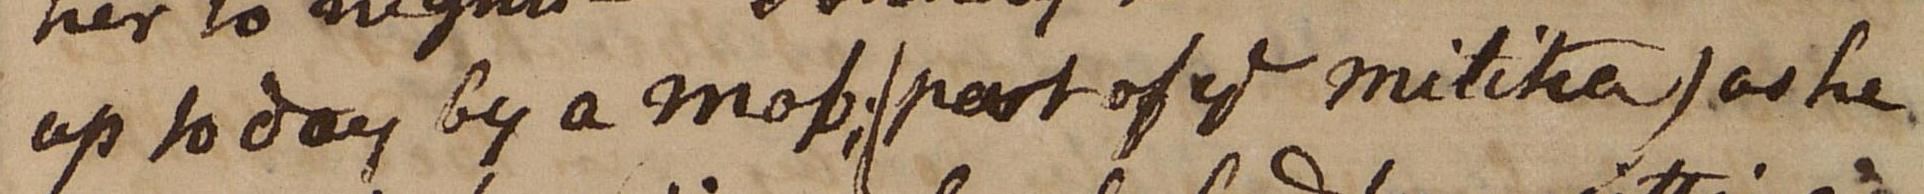up to day by a mob; (part of y^e militia )as he
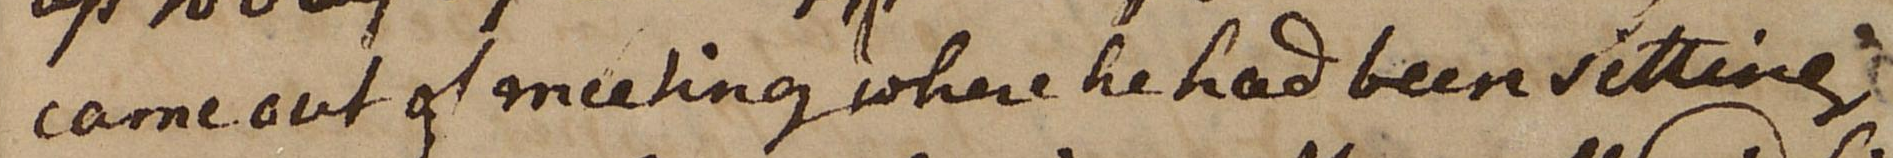came out of meeting where he had been sitting
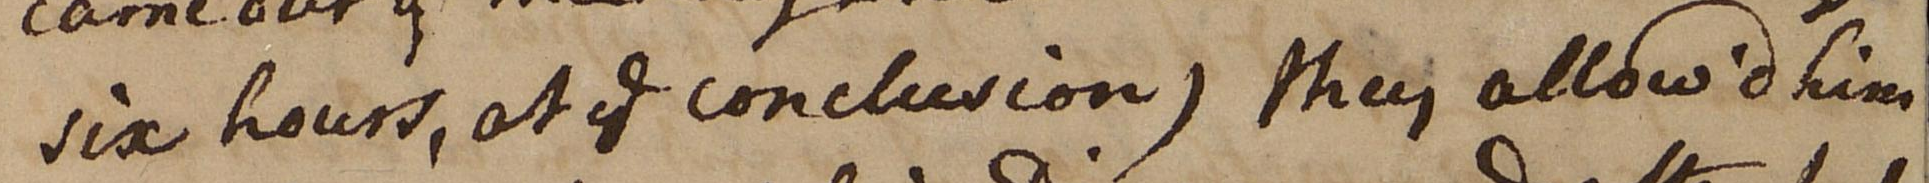six hours, at y^e conclusion) they allow'd him
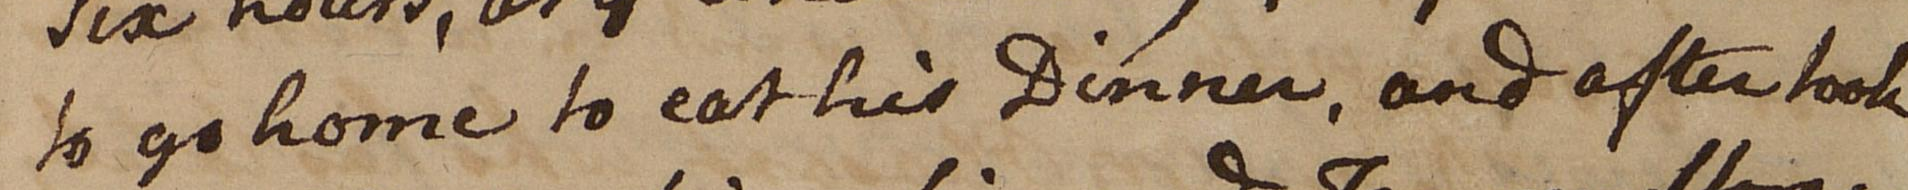to go home to eat his Dinner, and after took
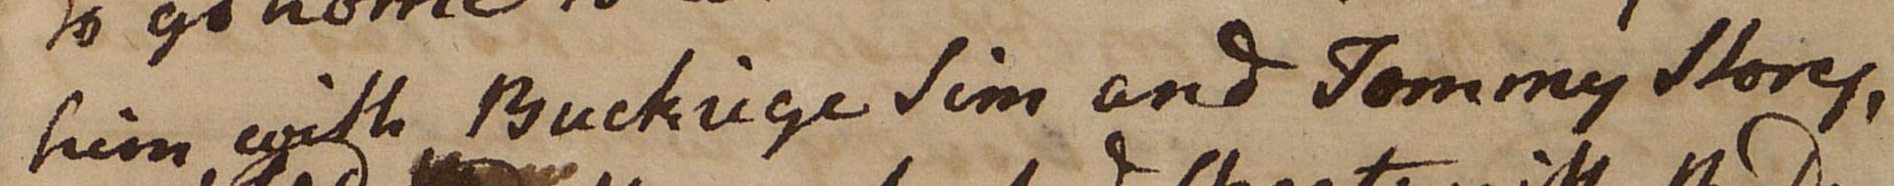him, with Buckrige Sim and Tommy Story,
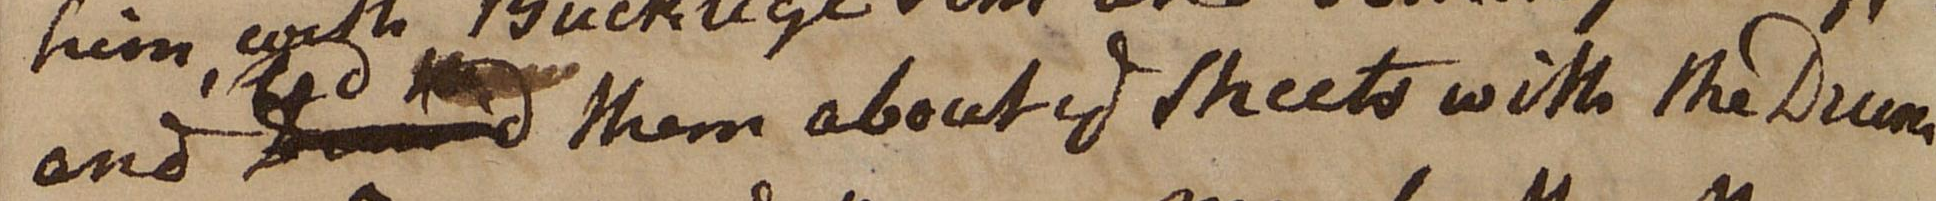and [_____] them about y^e Sheets with the Drum
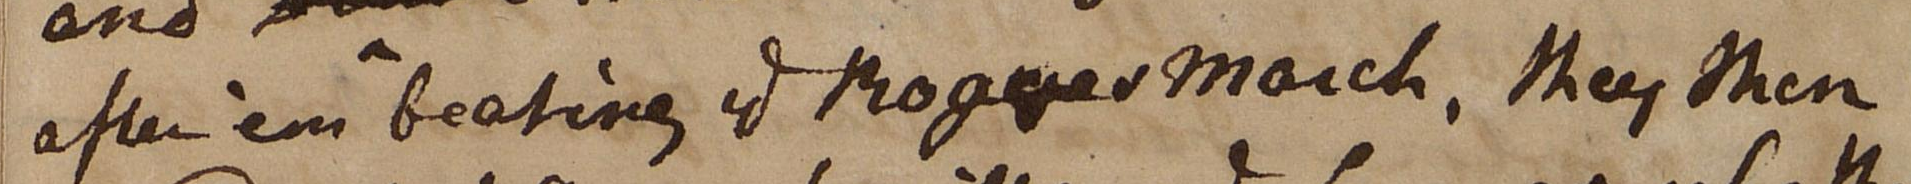after 'em beating y^e Roger March, they then
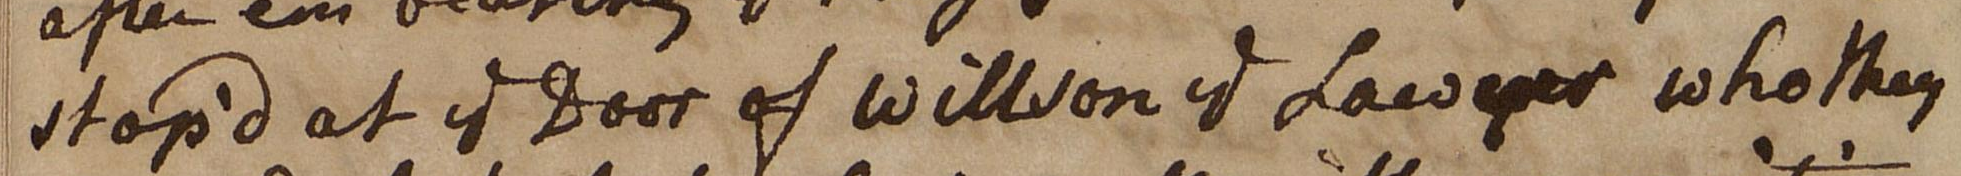stop'd at y^e Door of Willson y^e Lawyer who they
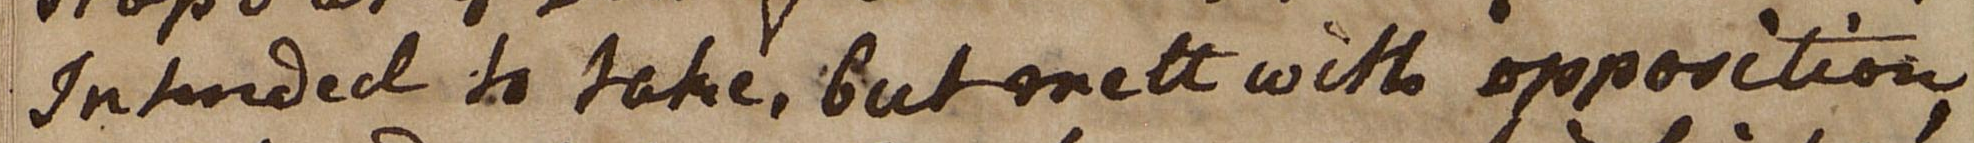Intended to take, but mett with opposition,
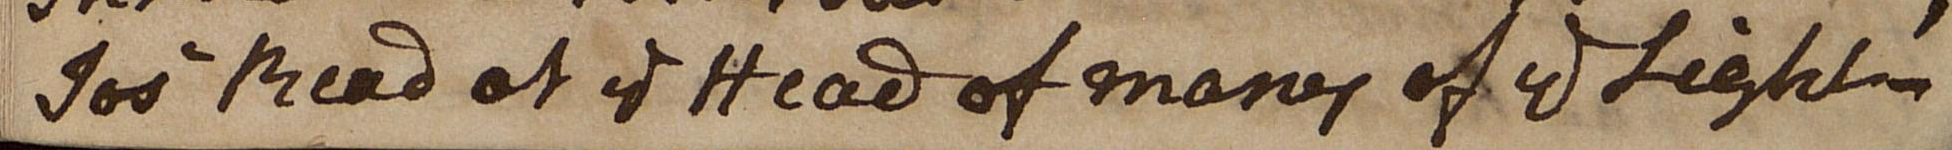Jos^a head at y^e Head of many of y^e Lights
